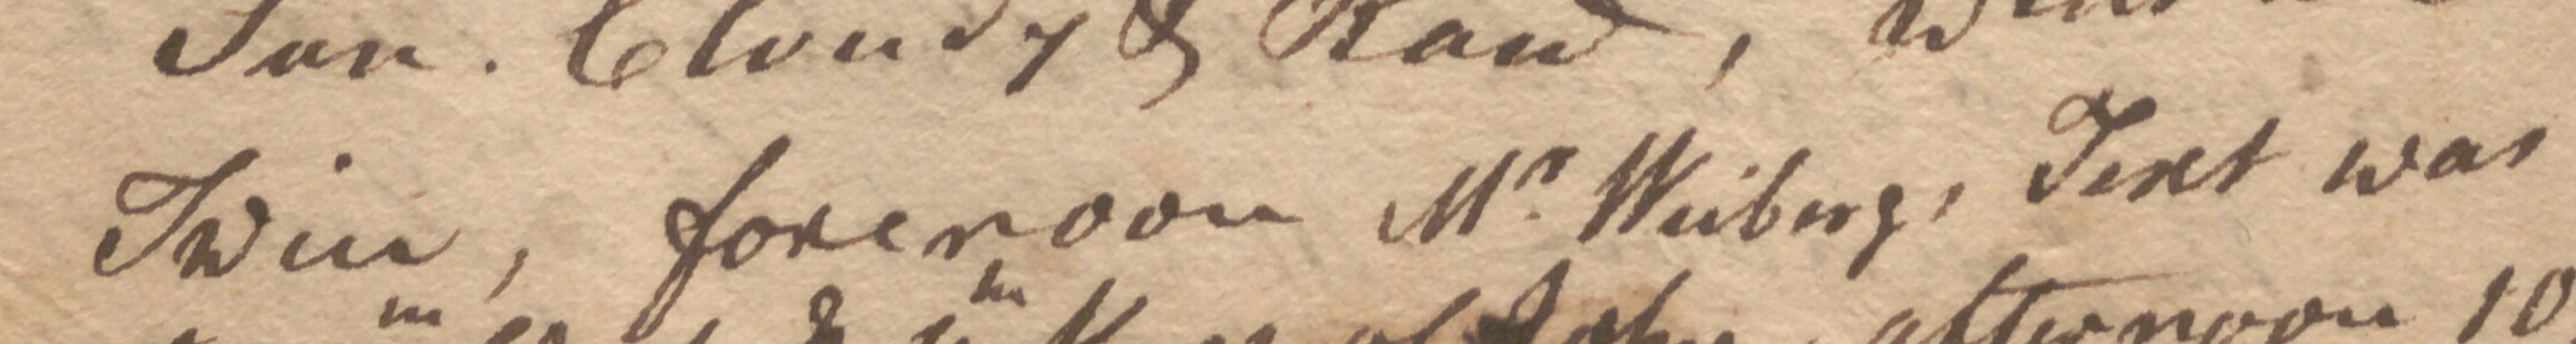Twice, forenoon, M^r. Weibergs Text was
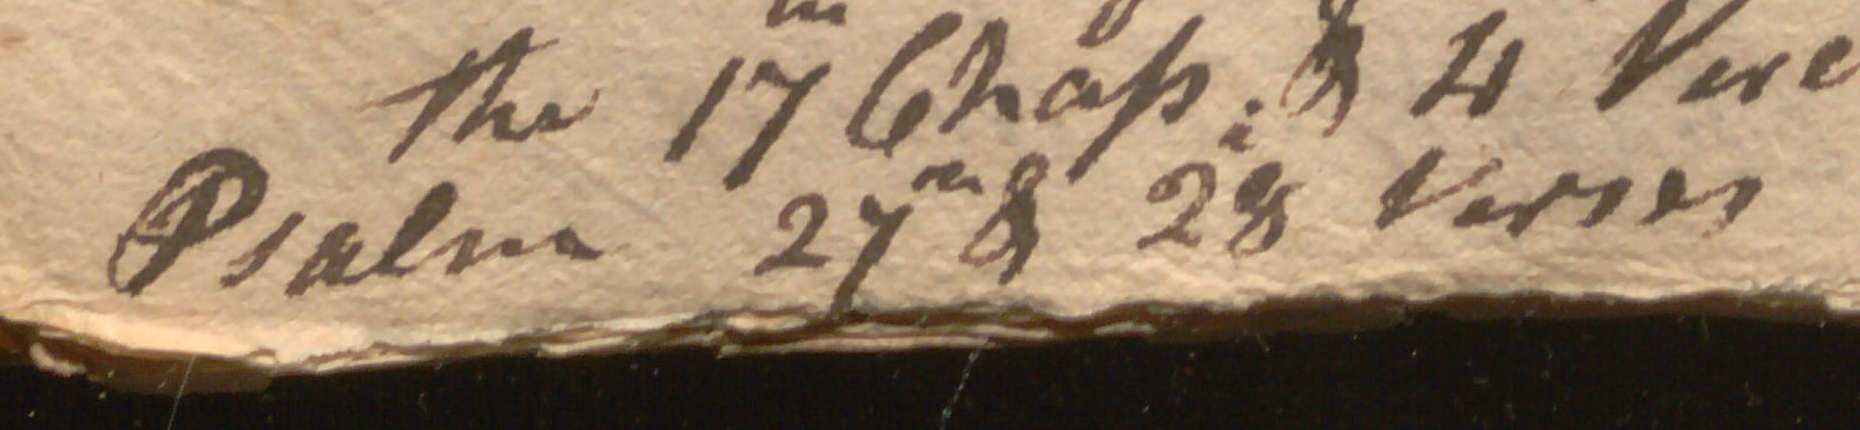Psalm 27^th & 28^h Verses
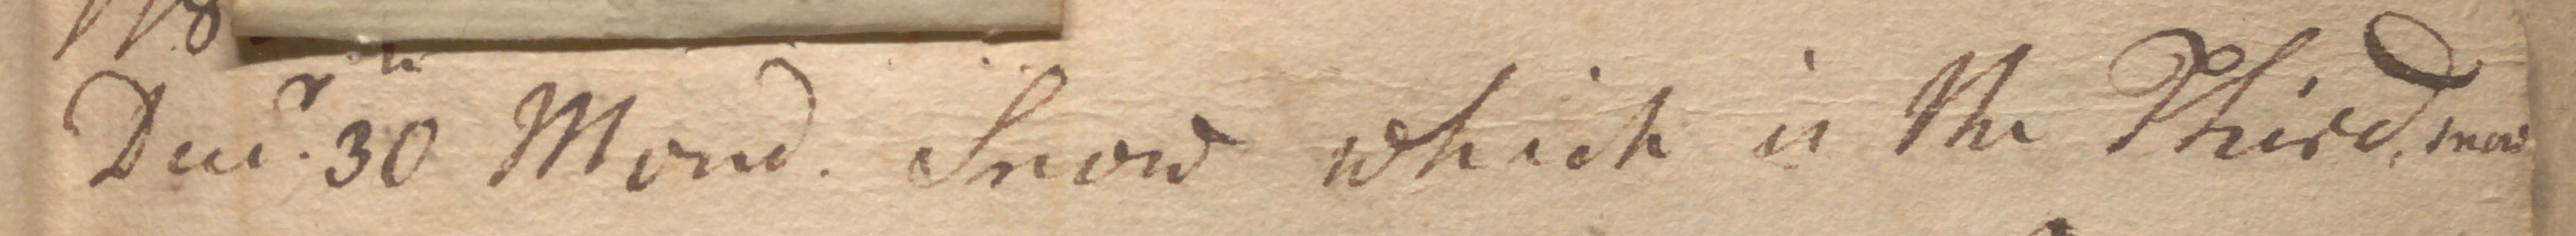Dec^r. 30 Mond. Snow which is the Third snow
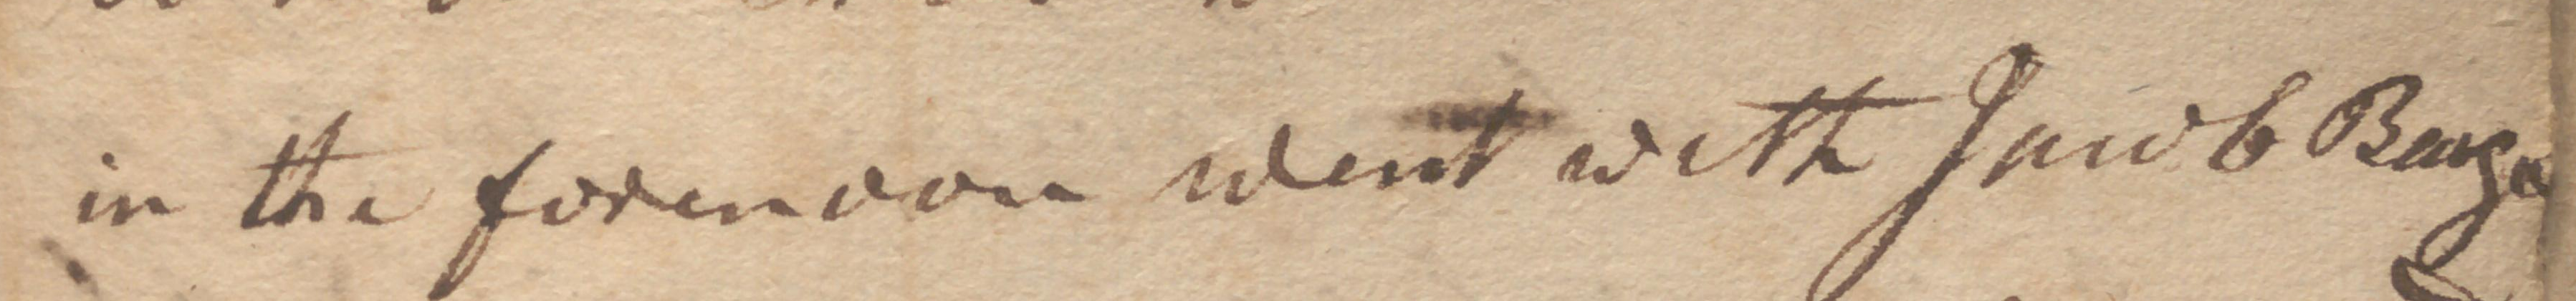in the forenoon went with Jacob Barge
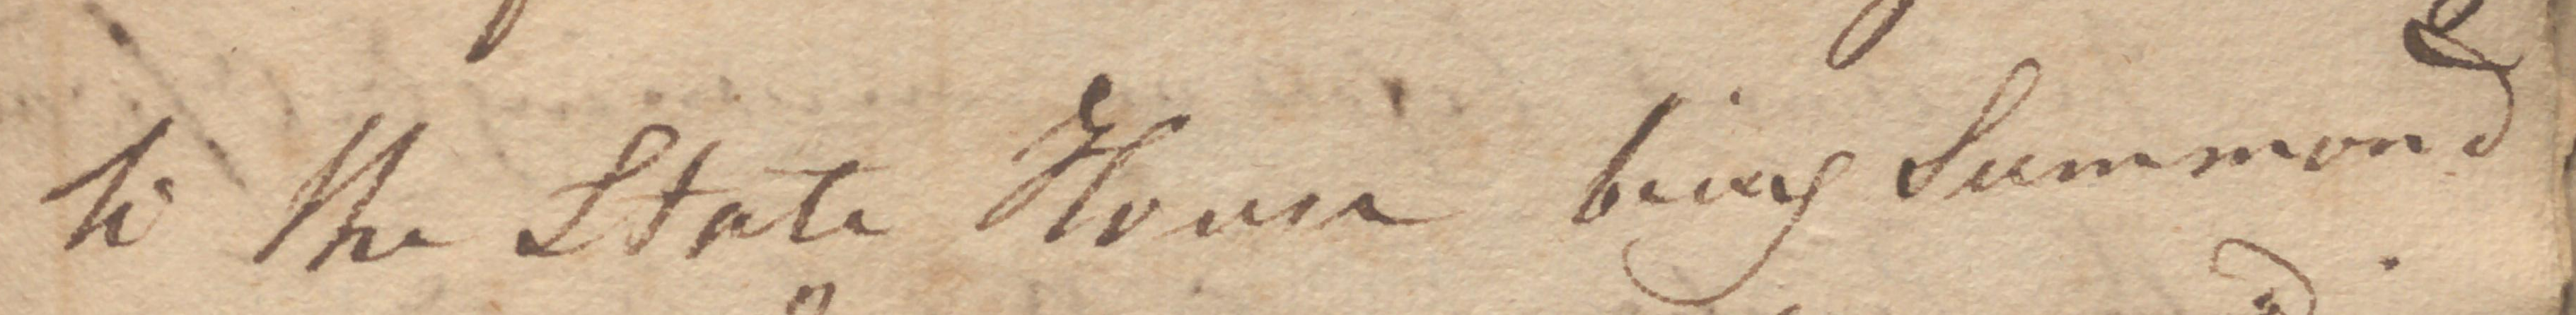to the State House, being Summond
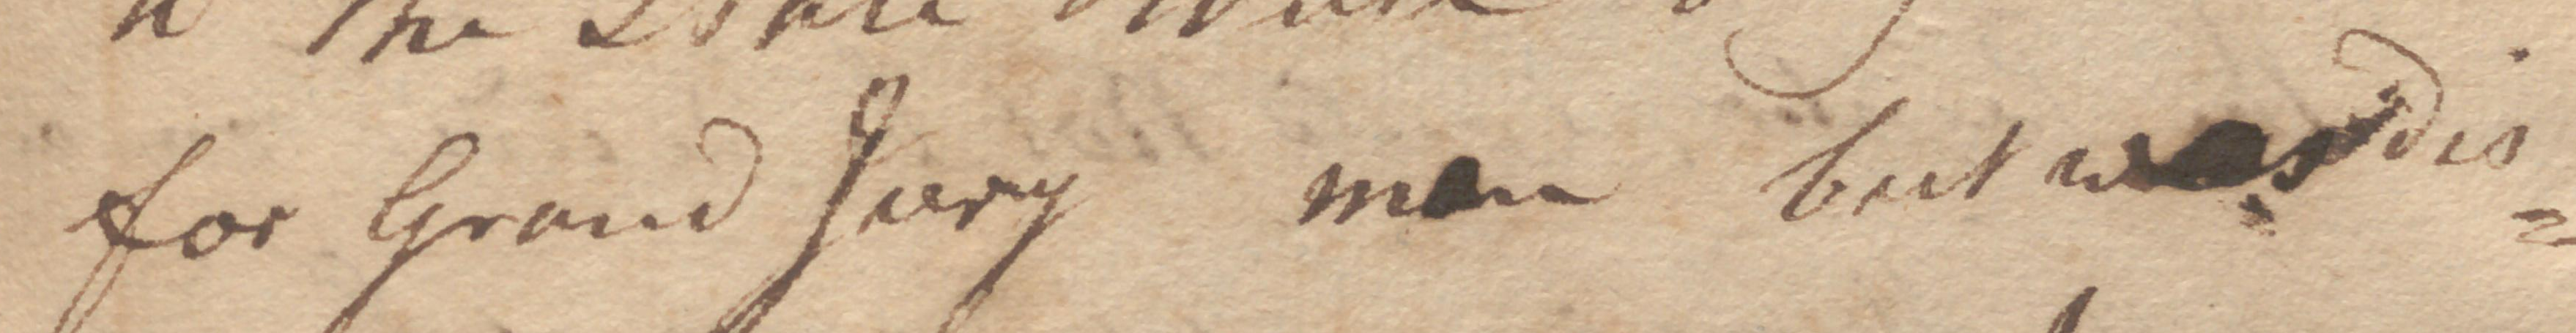for Grand Jury man but was dis-
